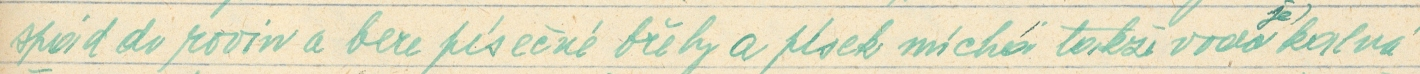spád do rovin a bere písečné břehy a písek míchá takže voda je kalná
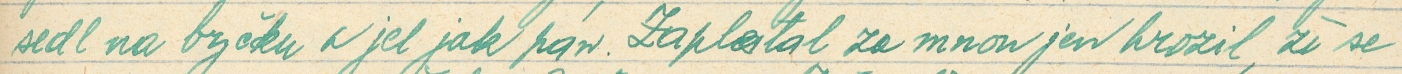sedl na bryčku a jel jak pán. Zapletal za mnou jen hrozil, že se
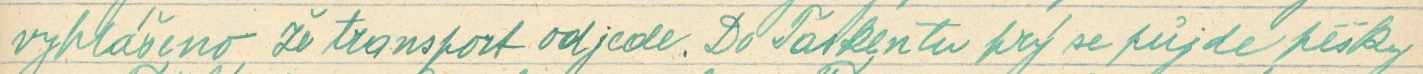vyhlášeno, že transport odjede. Do Taškentu prý se půjde pěšky
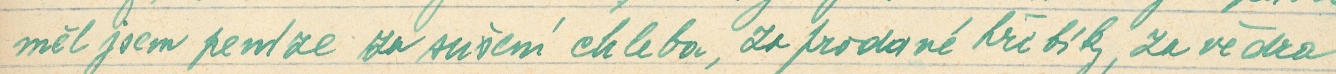měl jsem peníze za sušení chleba, za prodané hřebíky, za vědra
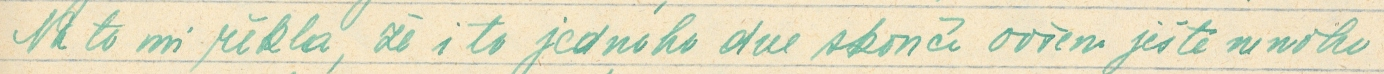Na to mi řekla, že i to jednoho dne skončí ovšem ještě mnoho
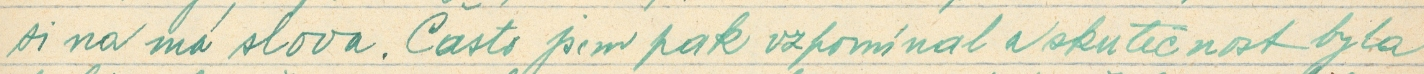si na má slova. Často jsem pak vzpomínal a skutečnost byla
